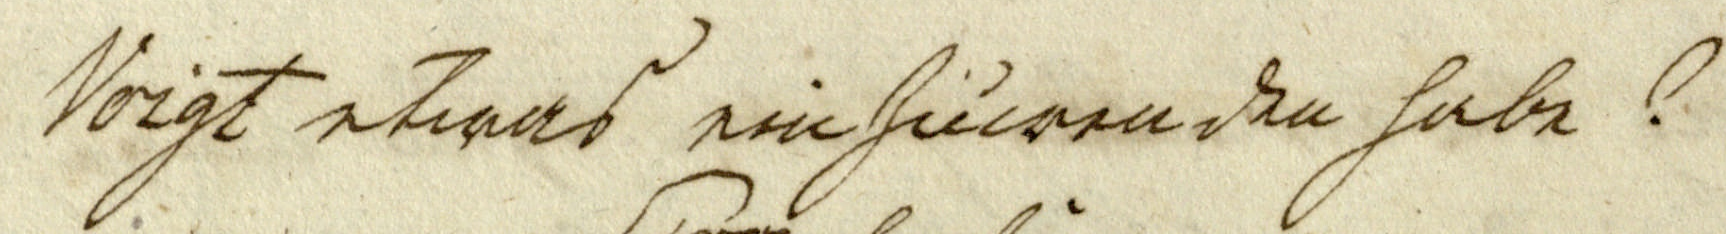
Voigt etwas einzuwenden habe!
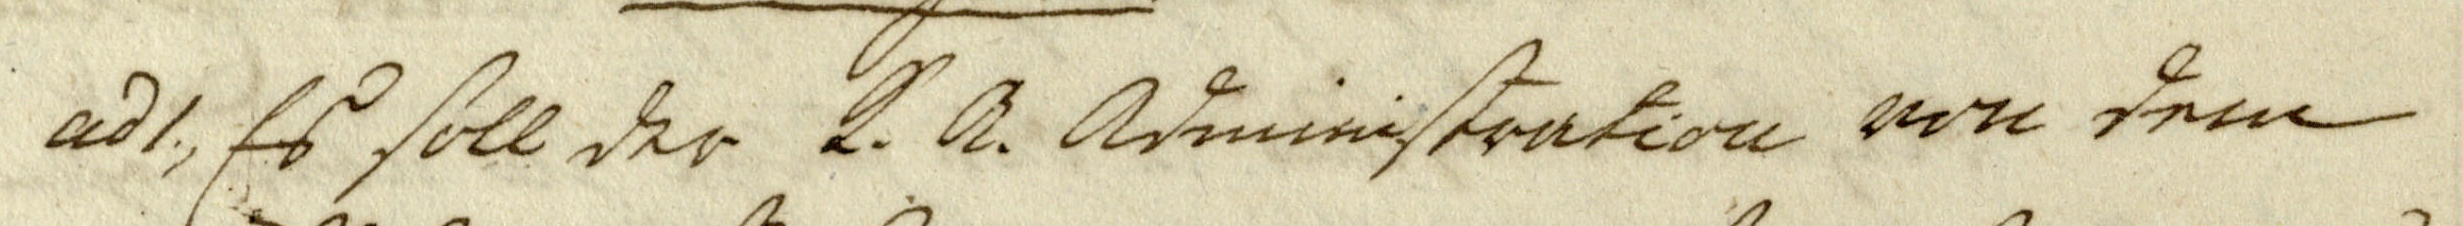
ad 1., Es soll der K. A. Administration von dem
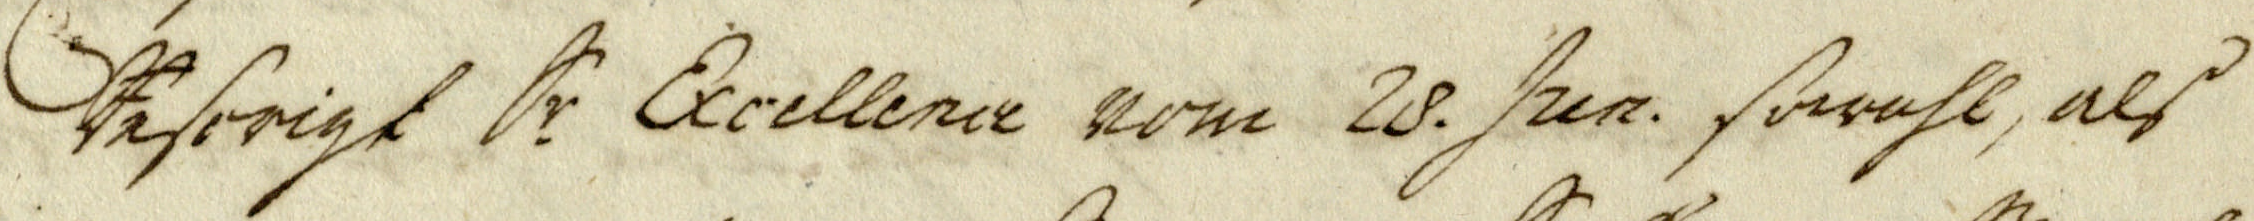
Rescript Sr. Excellence vom 28. Jun. sowohl, als
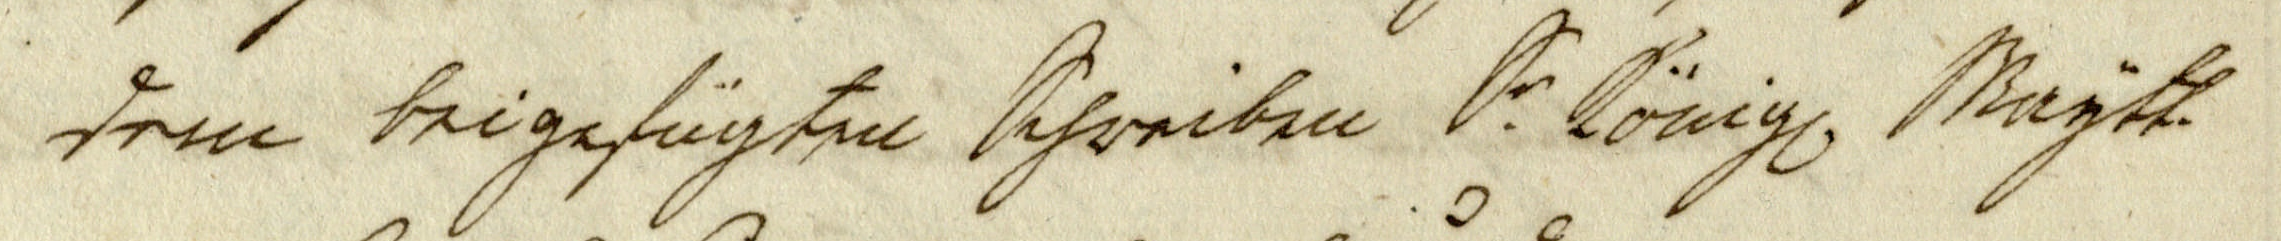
dem beigefügten Schreiben Sr. Königl. Maÿtt.
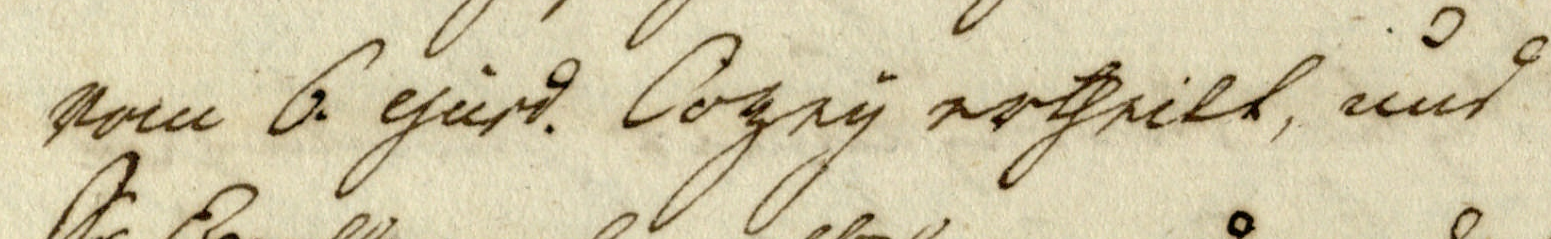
vom 6. ejusd. Copeÿ ertheilt, und
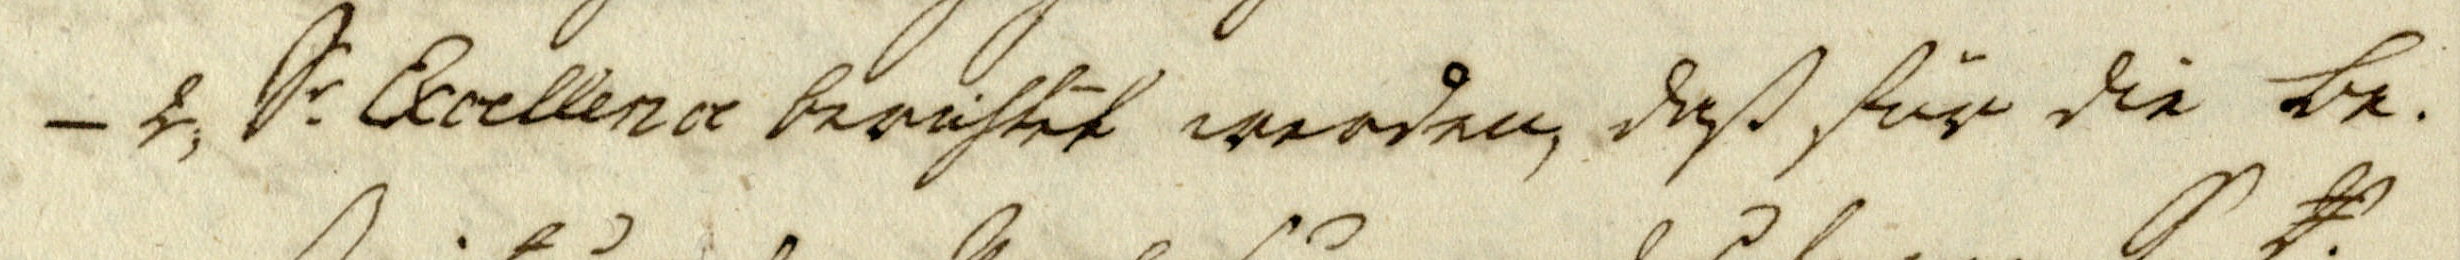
2, Sr. Excellence berichtet werden, daß für die Be¬
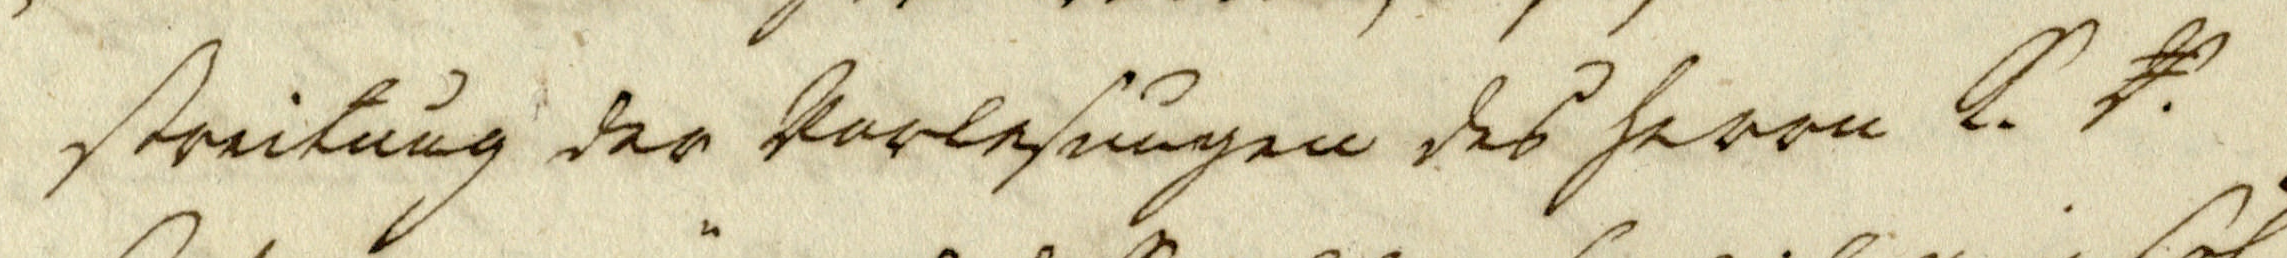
streitung der Vorlesungen des herrn K. R.
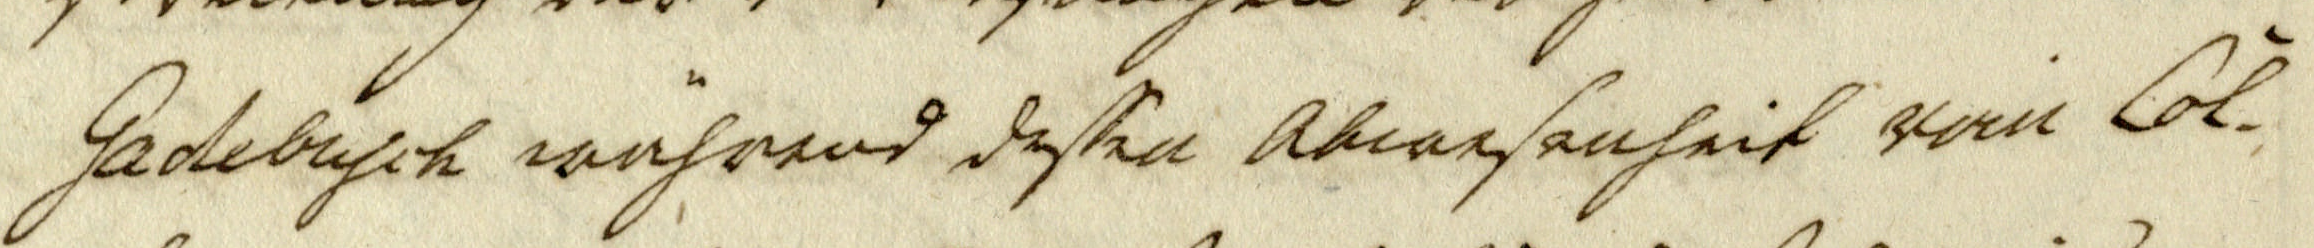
Gadebusch während dessen Abwesenheit vom Col¬
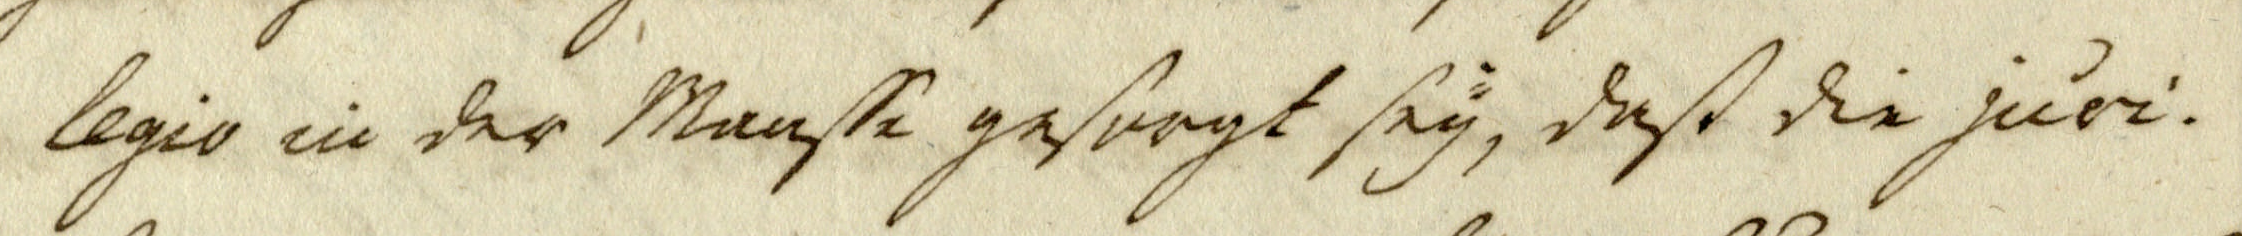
legio in der Maasse gesorgt seÿ, daß die juri¬
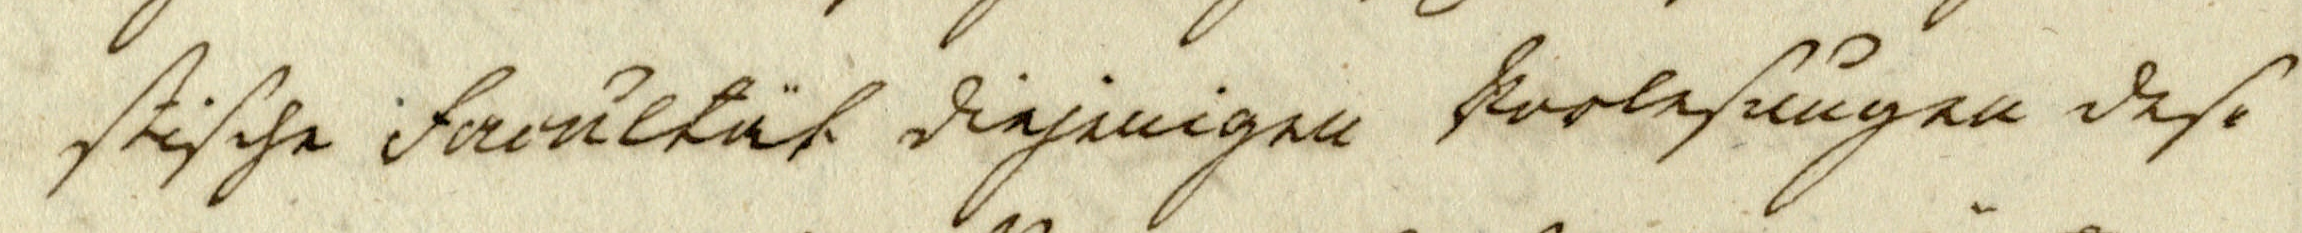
stische Facultät diejenigen Vorlesungen des¬
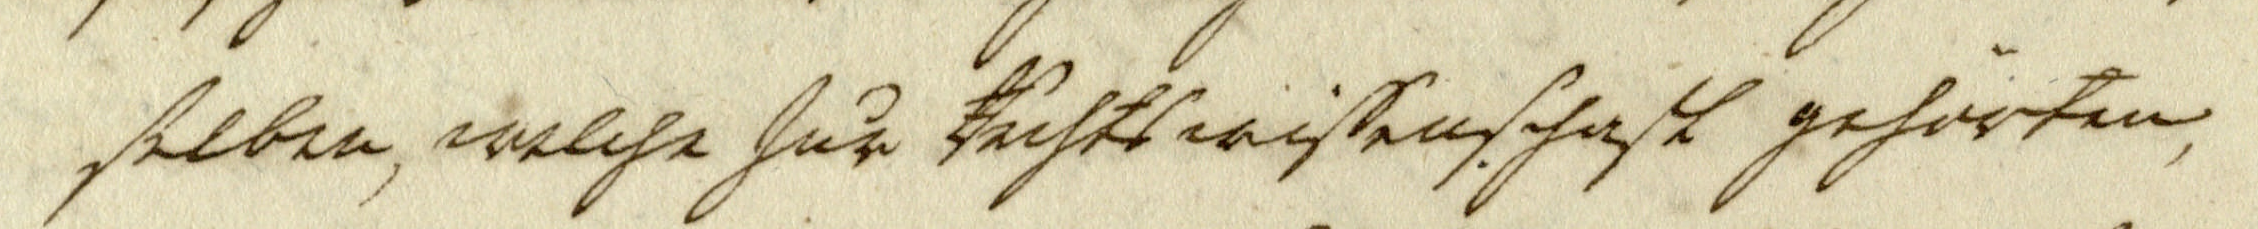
selben, welche zur Rechtswissenschaft gehörten,
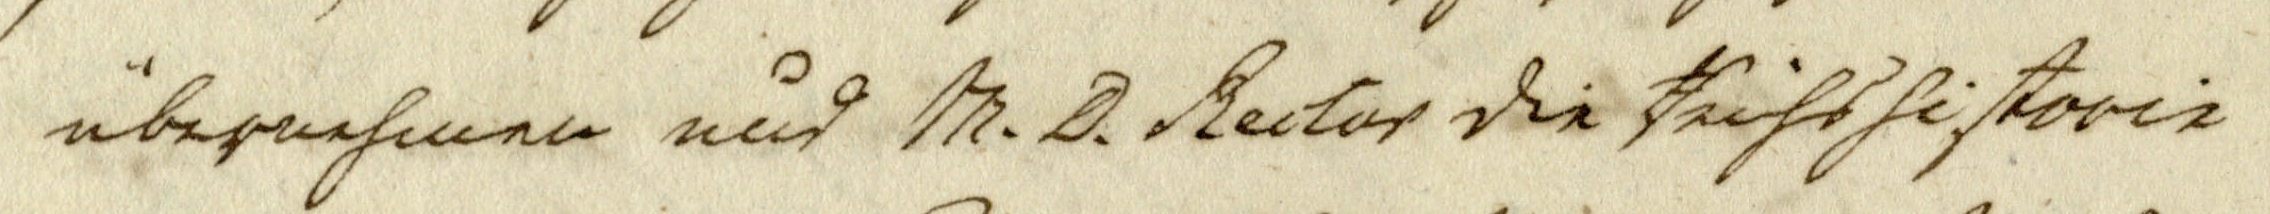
übernehmen und M. D. Rector die Reichshistorie
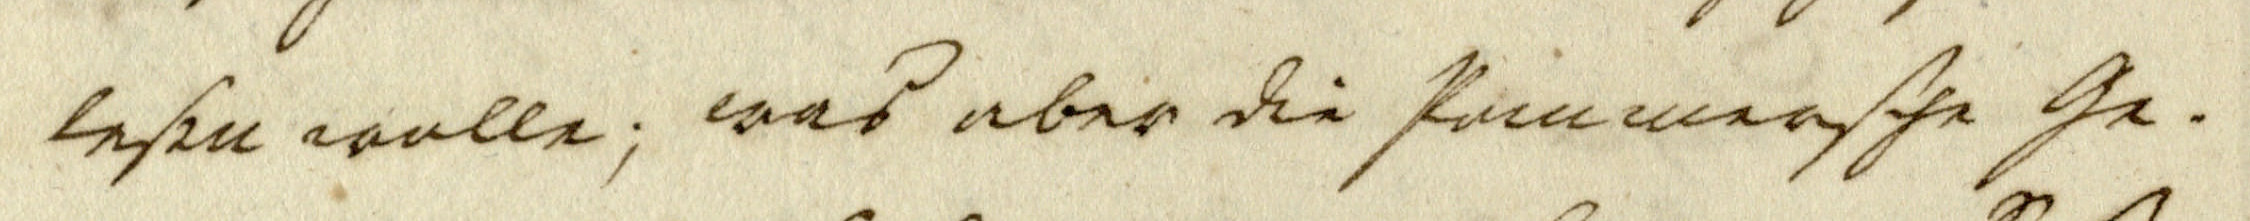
lesen wolle; was aber die Pommersche Ge¬
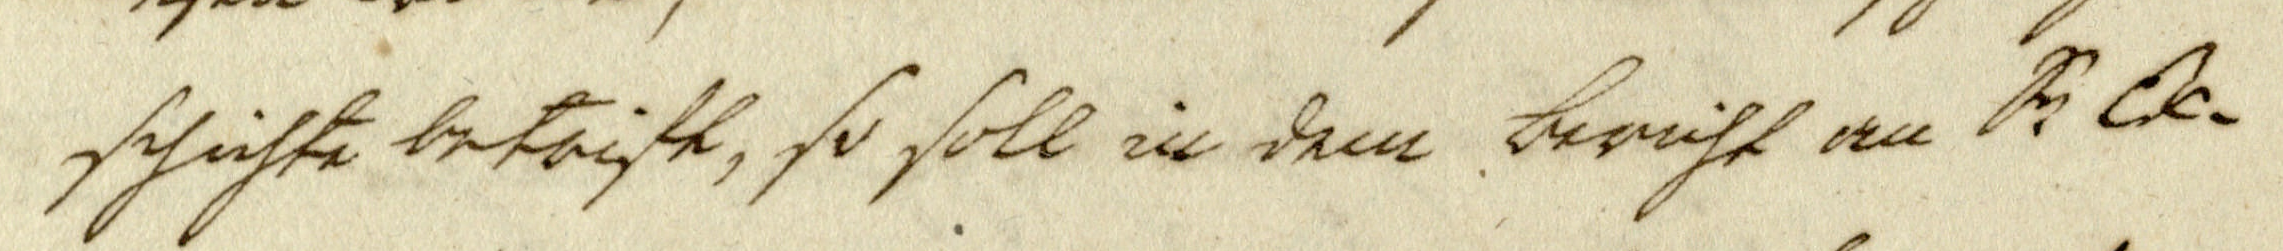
schichte betrifft, so soll in dem Bericht an Sr. Ex¬
